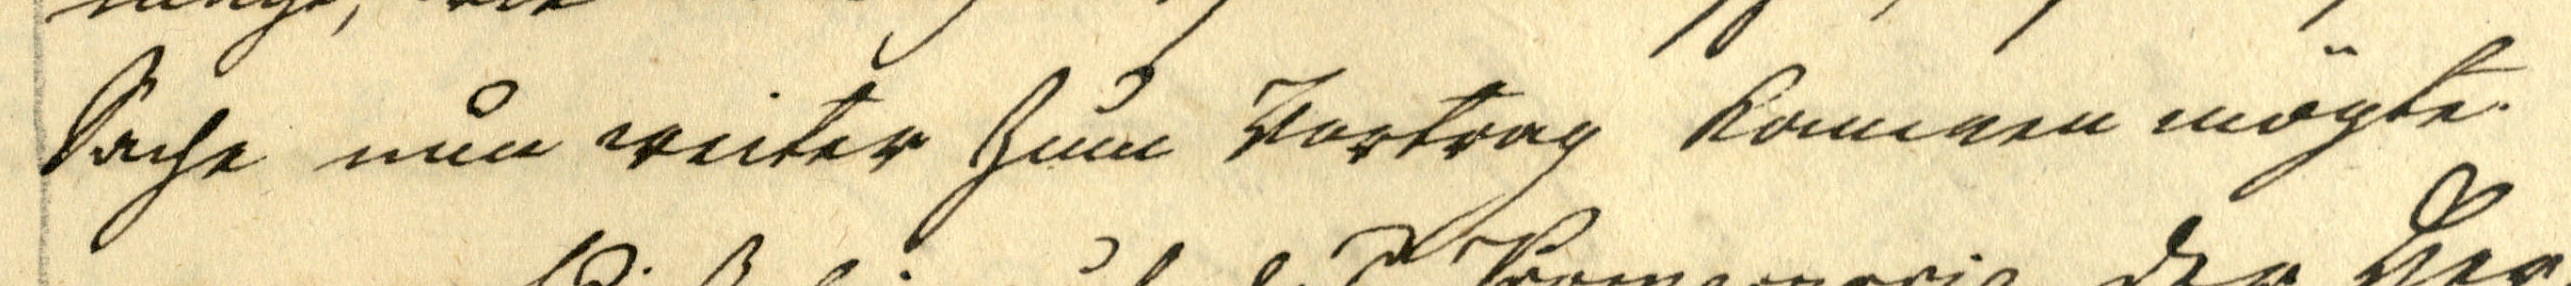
Sache nun weiter zum Vortrag kommen mögte.
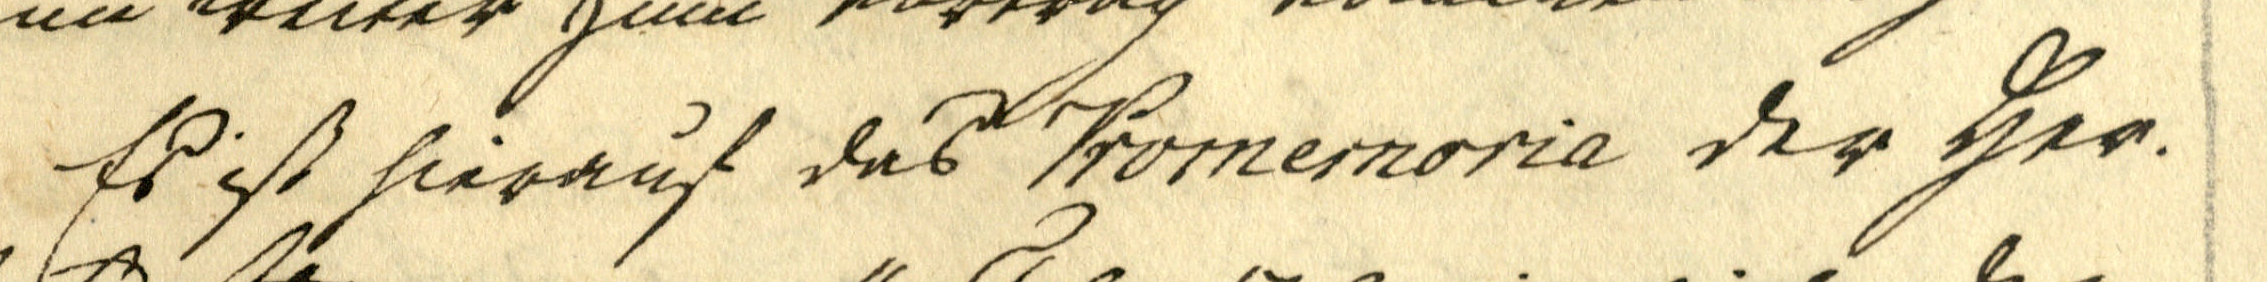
Es ist hierauf das Promemoria der Her¬
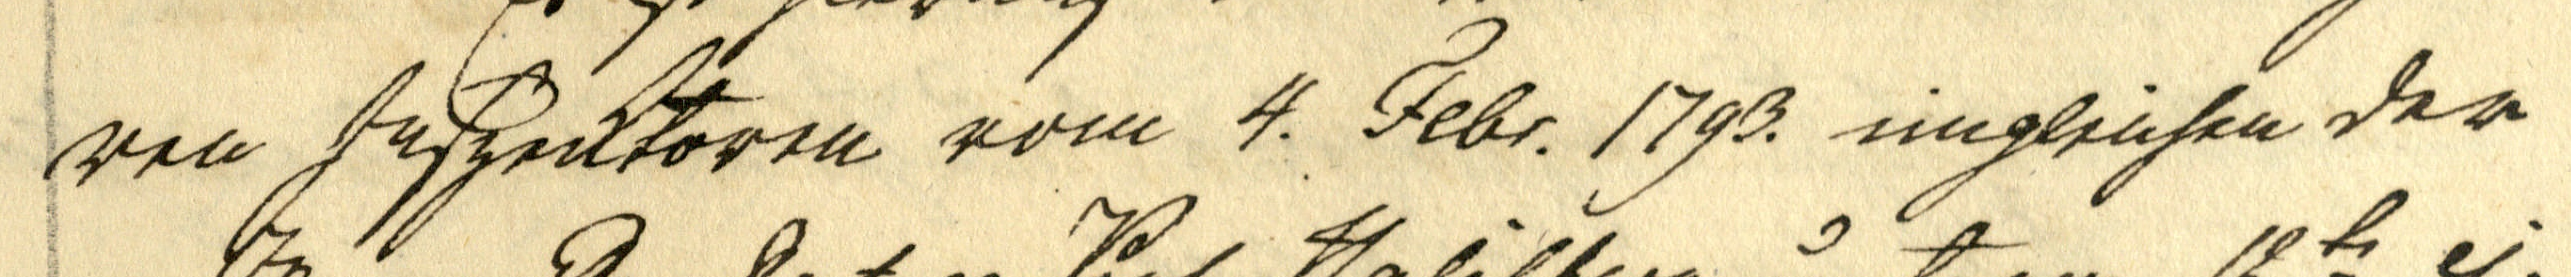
ren Inspecktoren vom 4. Febr. 1793. imgleichen der
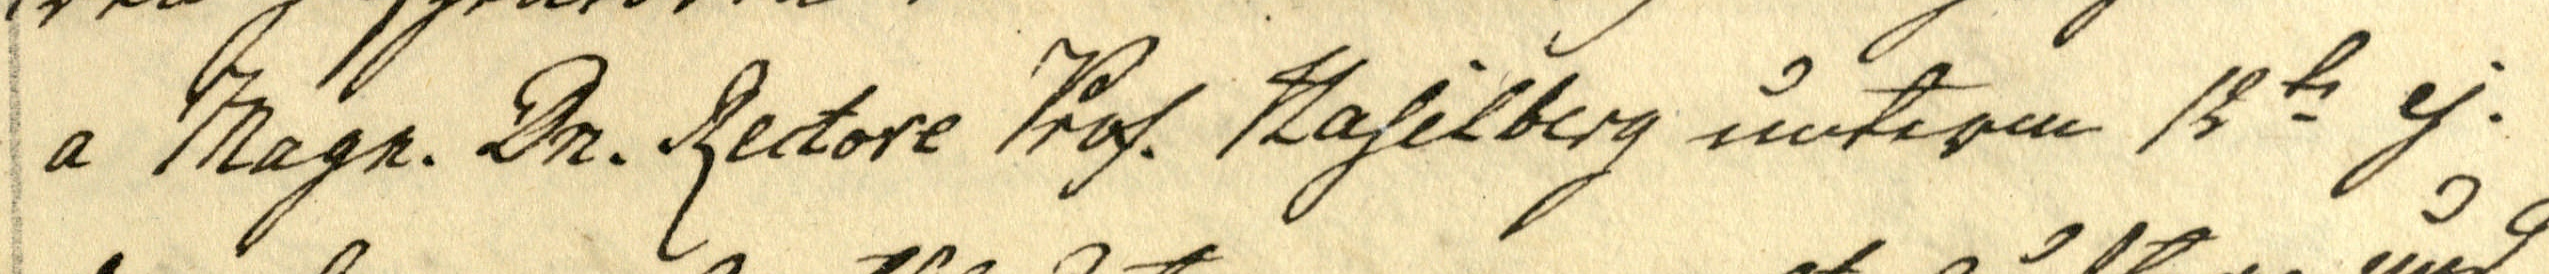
a Magn. Dn. Rectore Prof. Haselberg unterm 12. ej.
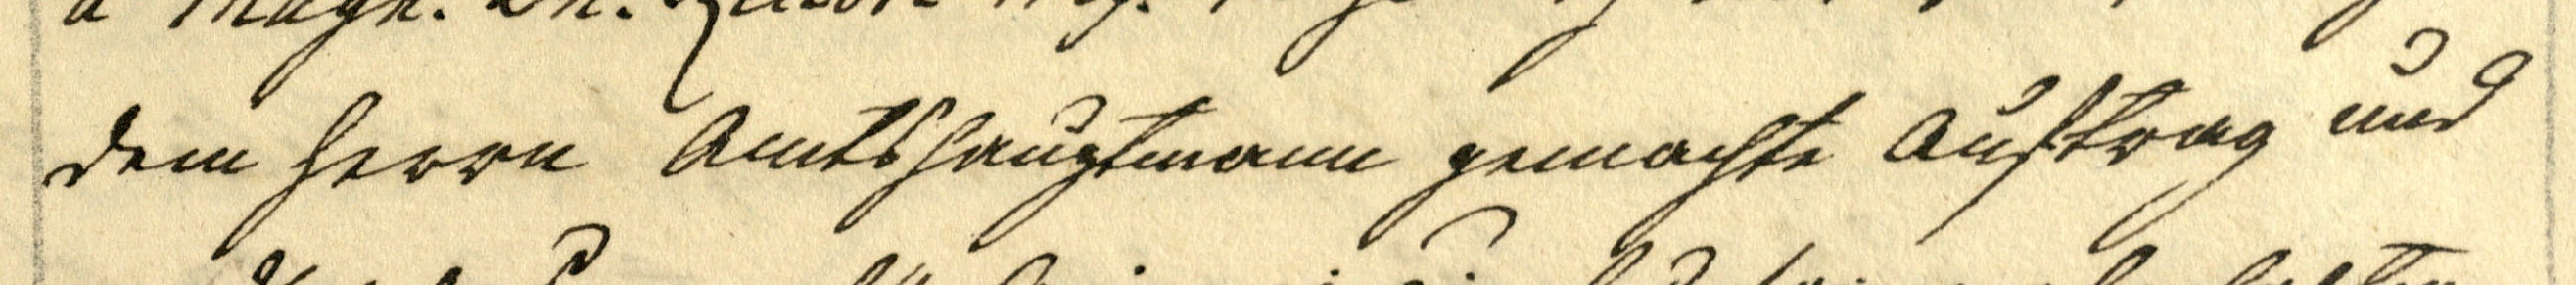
dem Herrn Amtshauptmann gemachte Auftrag und
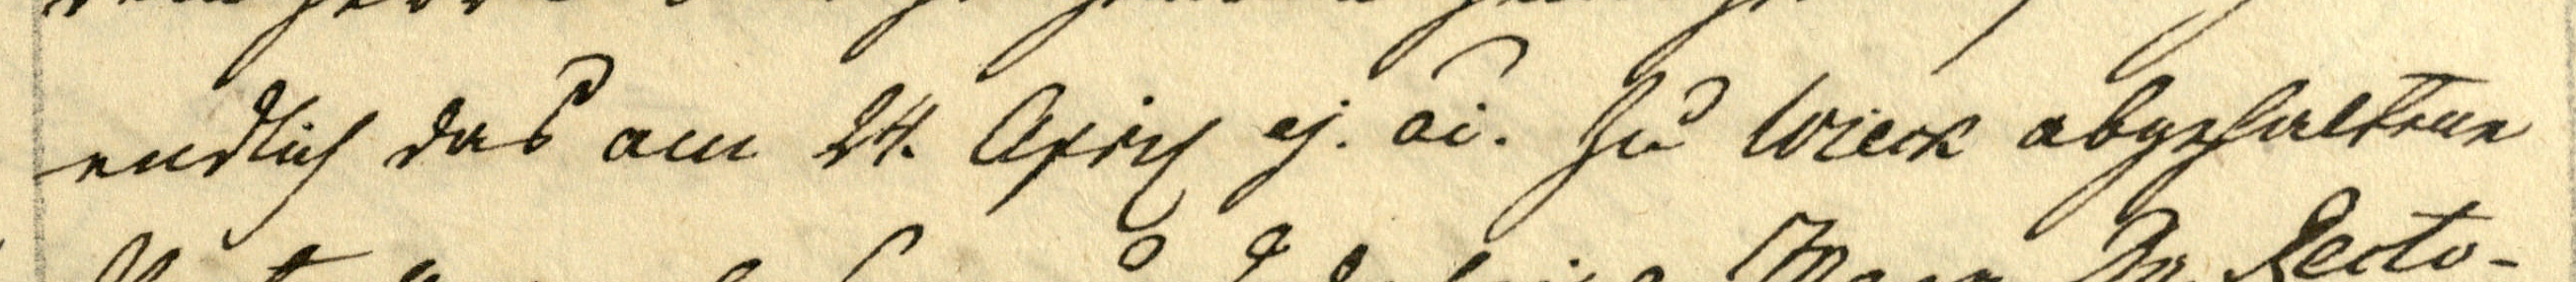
endlich das am 24. April ej. ai. zu Wieck abgehaltene
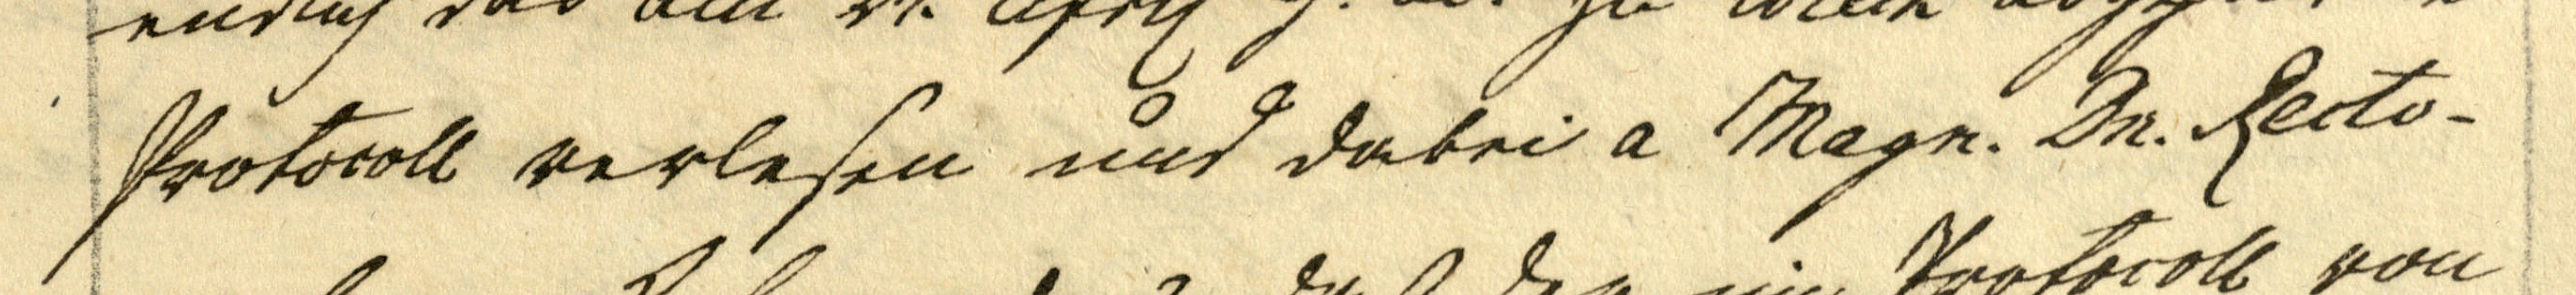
Protocoll verlesen und dabei a Magn. Dn. Recto¬
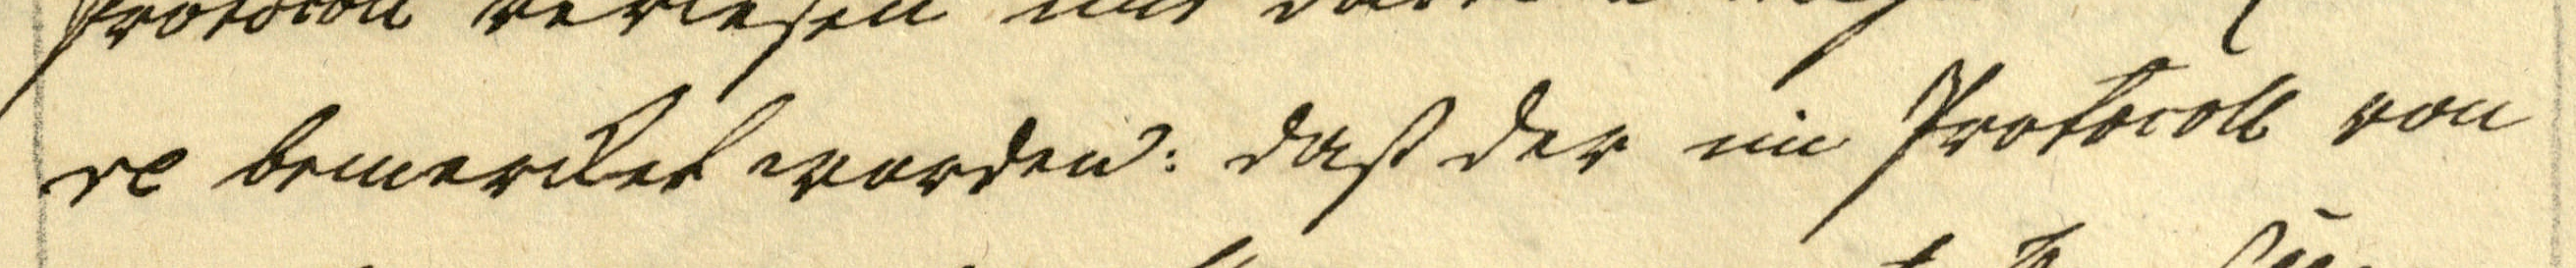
re bemercket worden: daß der im Protocoll von
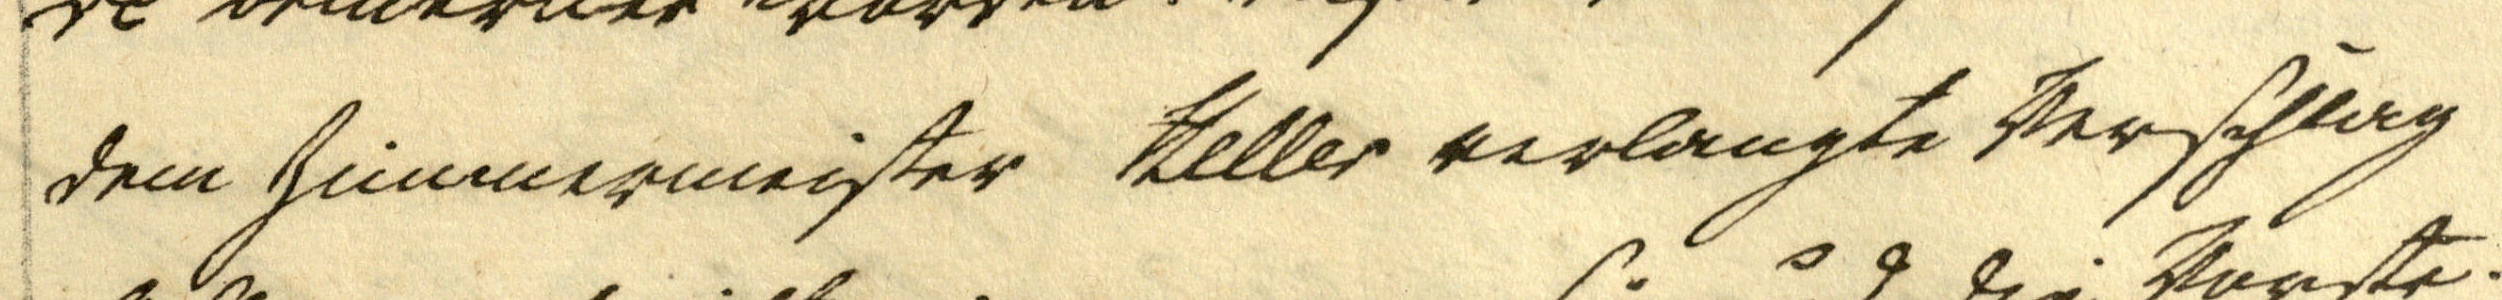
dem Zimmermeister Heller verlangte Verschlag
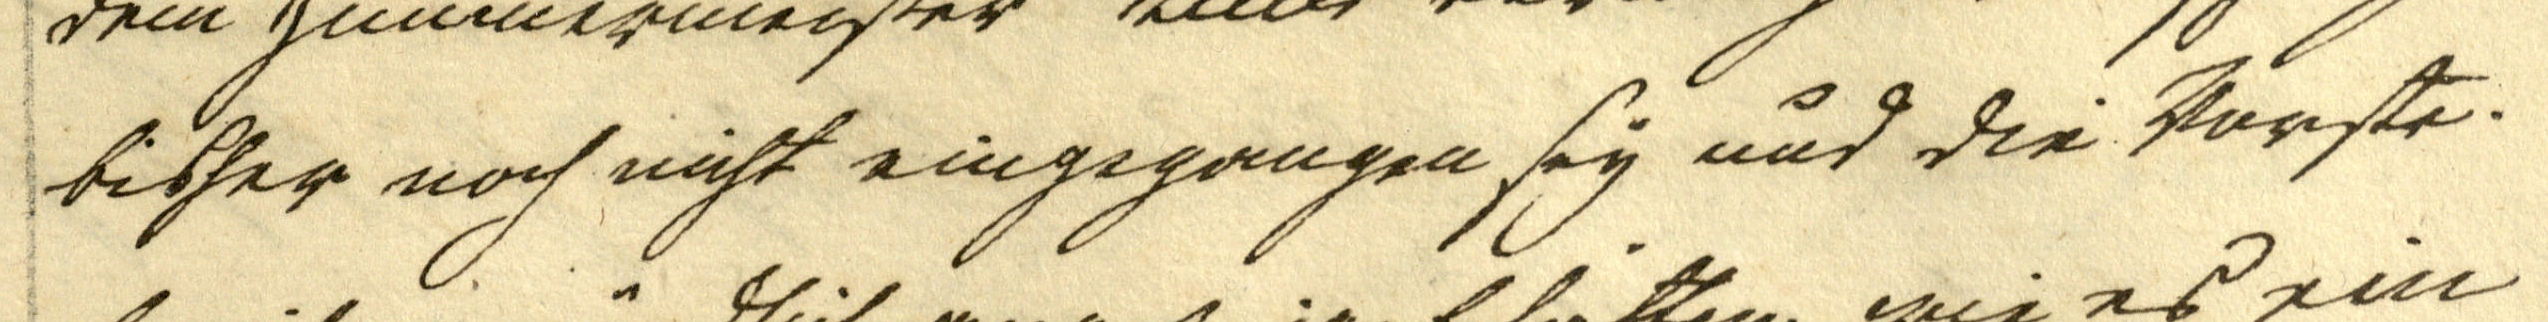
bisher noch nicht eingegangen seÿ und die Vorste¬
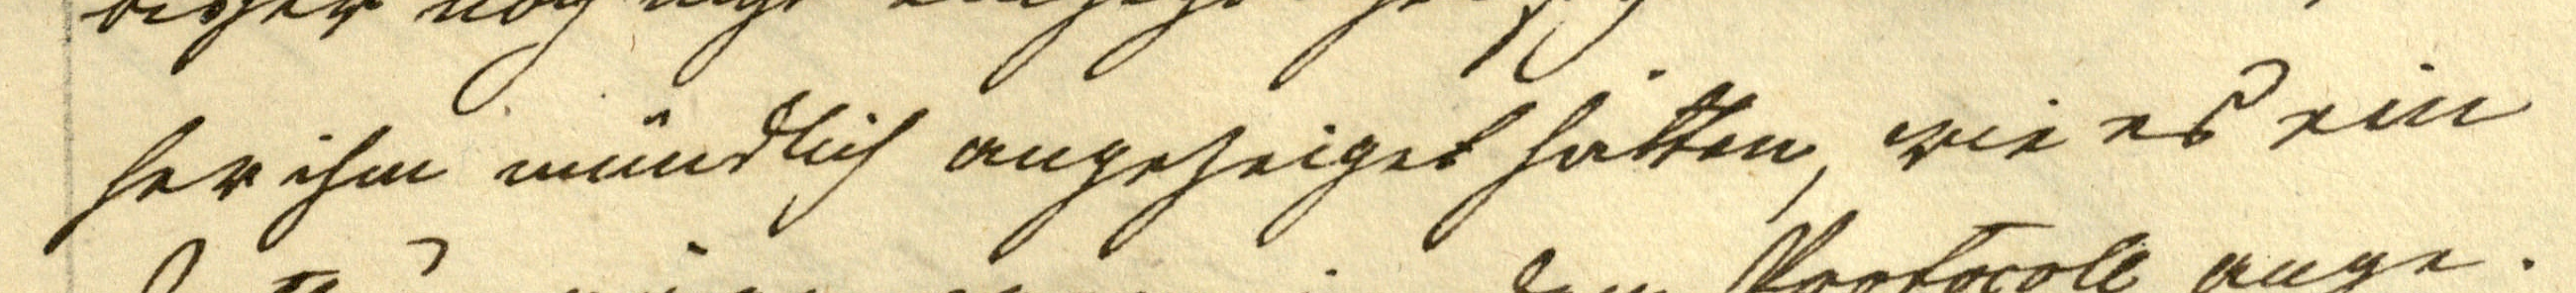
her ihm mündlich angezeiget hätten, wie es ein
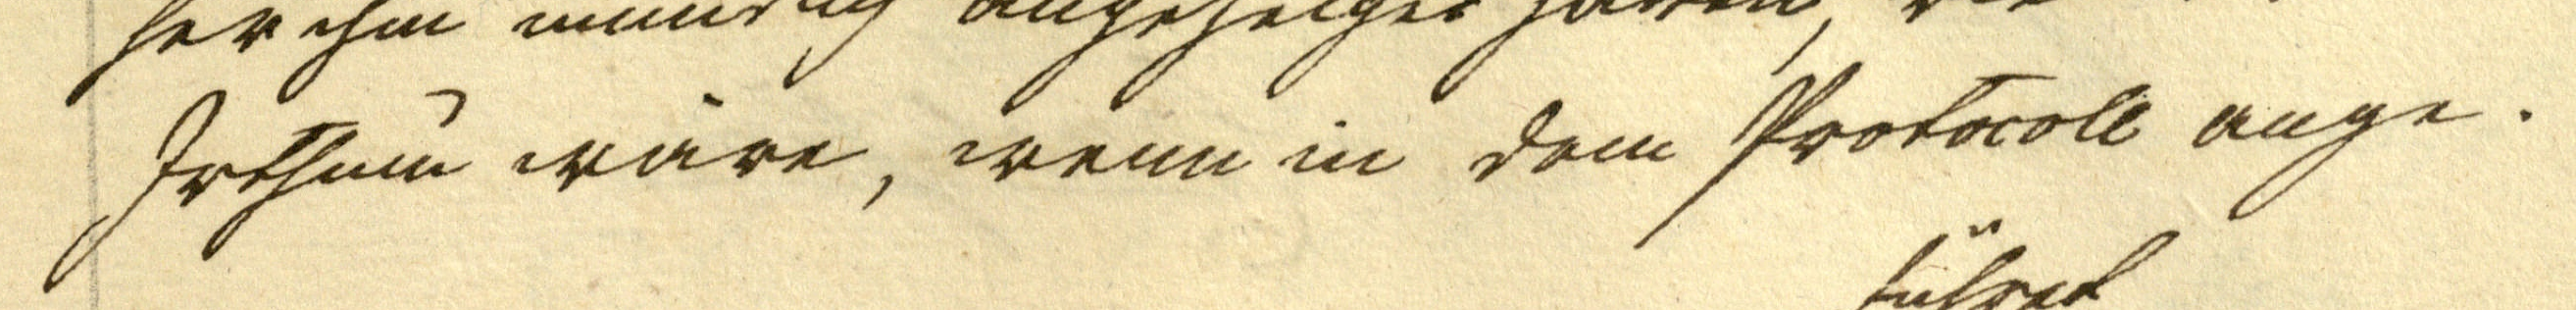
Irthum wäre, wenn in dem Protocoll ange¬
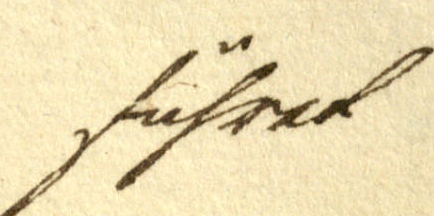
führet
